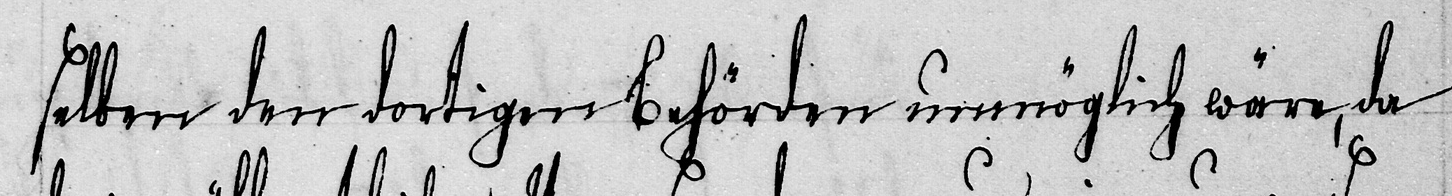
selben den dortigen Behörden unmöglich wäre, da
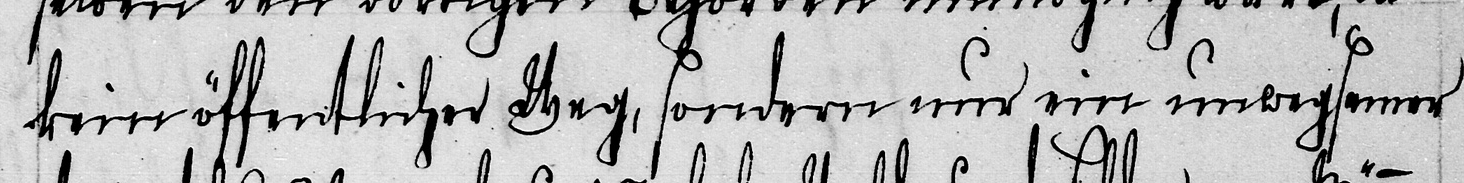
kein öffentlicher Weg, sondern nur ein unwegsamer
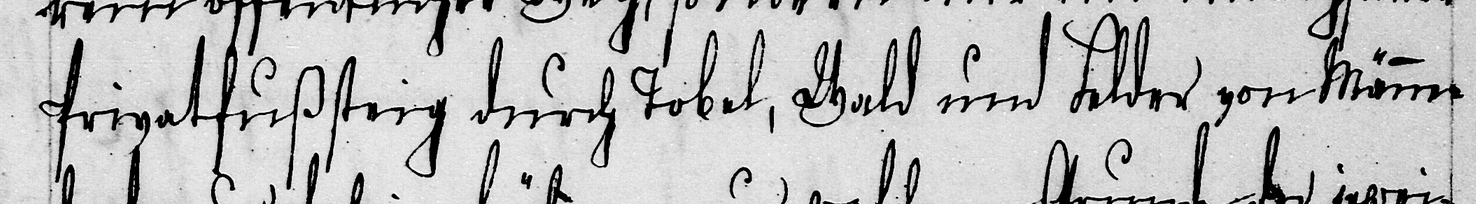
Privatfußsteig durch Tobel, Wald und Felder von Männe¬
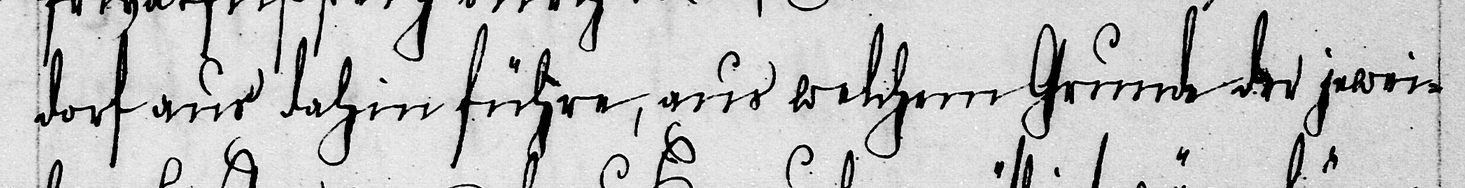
dorf aus dahin führe, aus welchem Grunde der jewei¬
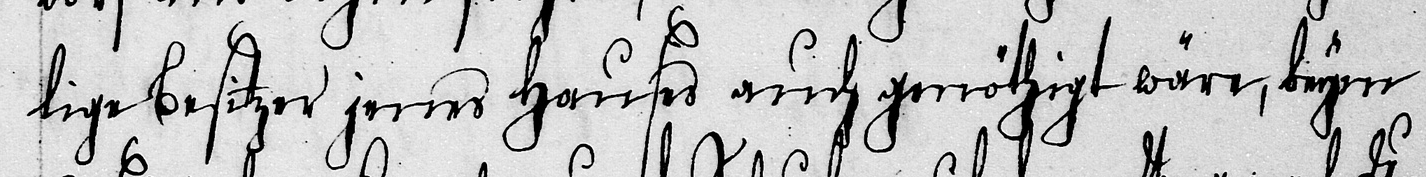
lige Besitzer jenes Hauses auch genöthigt wäre, beym
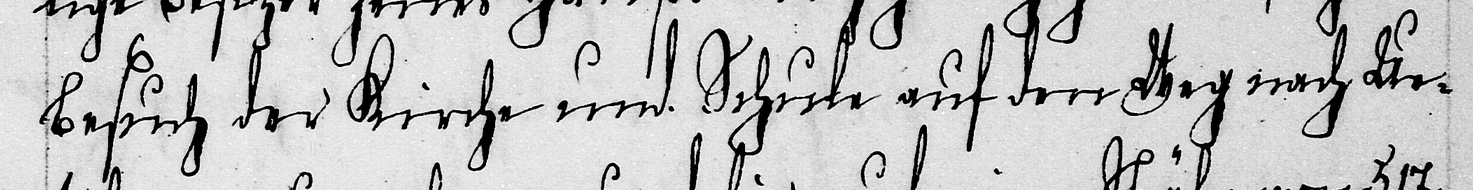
Besuch der Kirche und Schule auf den Weg nach Ue¬
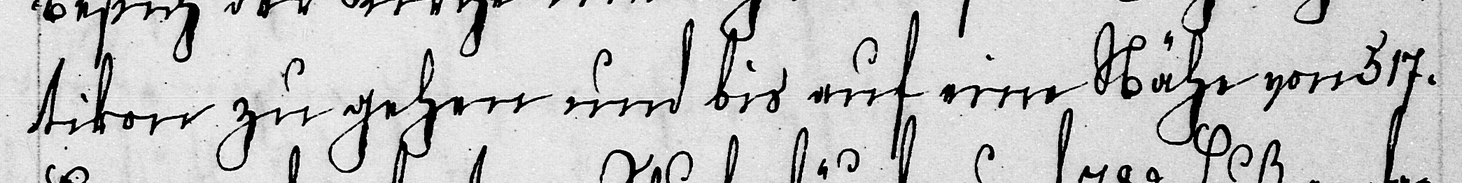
tikon zu gehen und bis auf eine Nähe von 517.
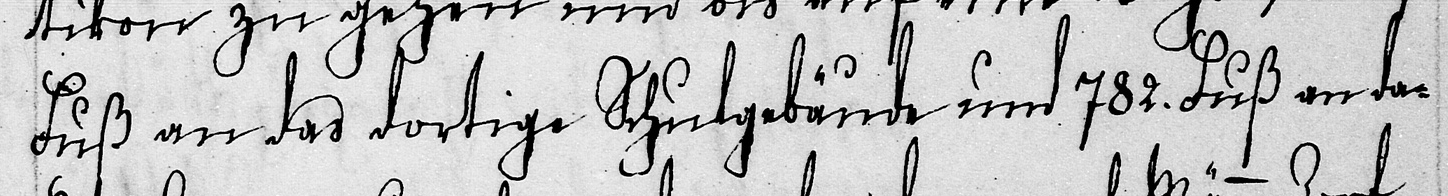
Fuß an das dortige Schulgebäude und 728. Fuß an da¬
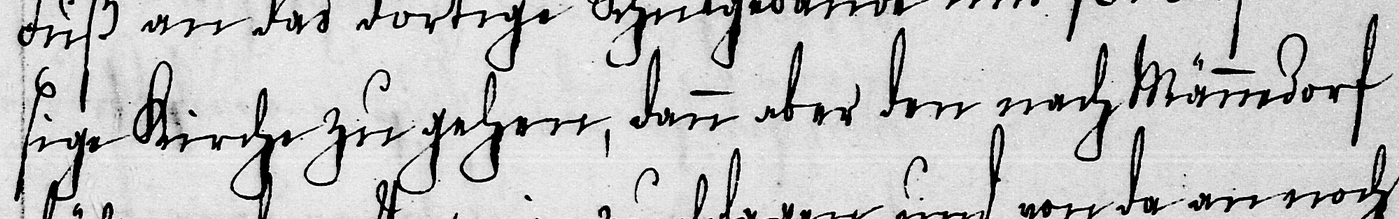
sige Kirche zu gehen, dann aber den nach Männedorf
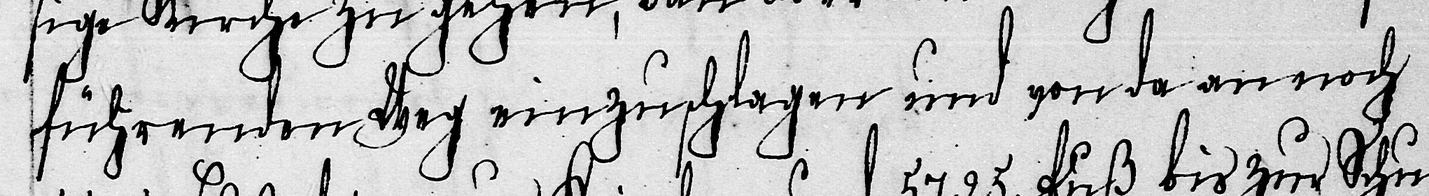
führenden Weg einzuschlagen und von da an noch
